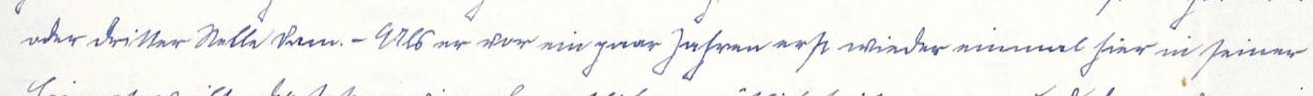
oder dritter Stelle kann.- Als er vor ein paar Jahren erst wieder einmal hier in seiner
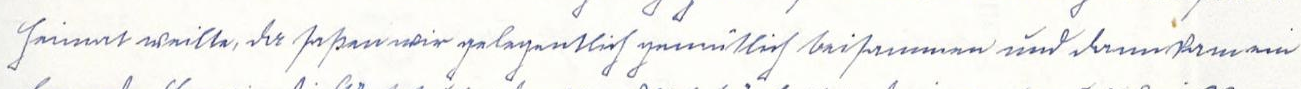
Heimat weilte, saßen wir gelegentlich gemütlich beisammen und dann kam ein
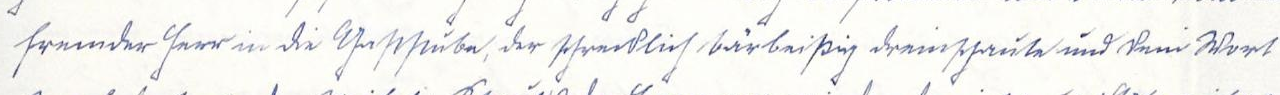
fremder Herr in die Gaststube, der schrecklich bärbeißig dreinschaute und kein Wort
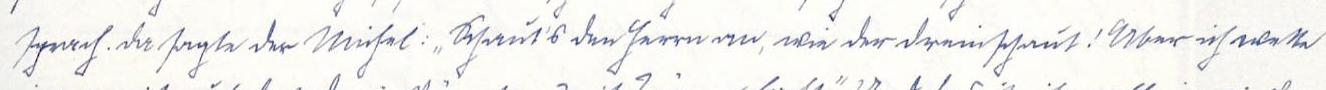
sprach. Da sagte der Michael: "„Schauts den Herrn an, wie der reinschaut Aber ich wettee
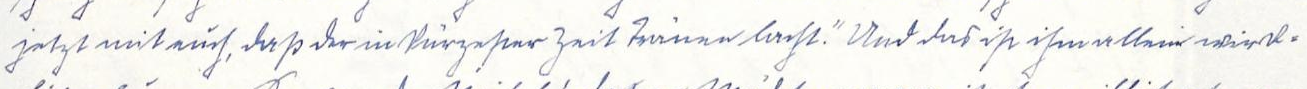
jetzt mit euch, daß der in kürzester Zeit Tränen acht. Und das ist ihm allein wir-
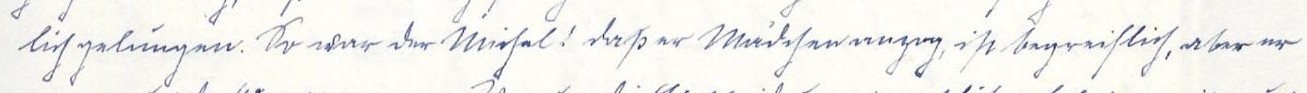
lich gelungen. So war der Michael! Daß er Mädchen anzog, ist begreiflich, aber er
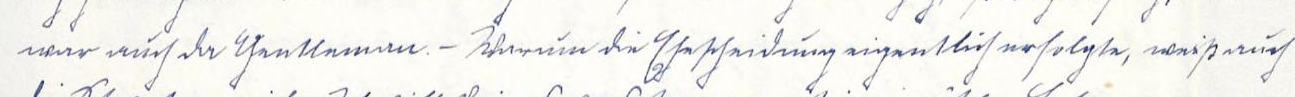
war auch da Gentleman. Warum die Ehescheidung eigentlich erfolgte, weiß auch
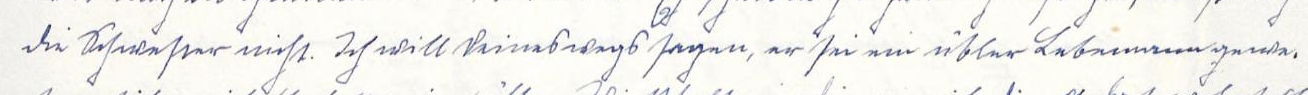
die Schwester nicht. Ich will keineswegs sagen, er sei ein übler Lebemann gewe-
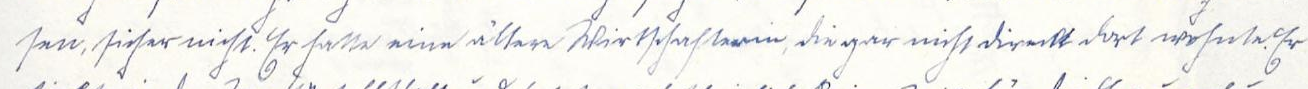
sein, sicher nicht. Er hatte eine ältere Wirtschafterin, die gar nicht direkt dort wohnte. Er
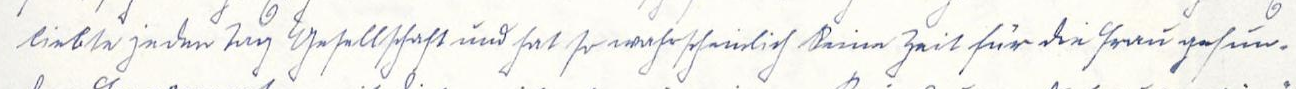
liebte jeden Tag Gesellschaft und hat so wahrscheinlich keine Zeit für die Frau gefun-
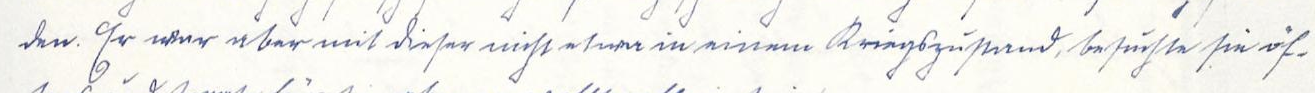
den. Er war aber mit dieser nicht etwa in einem Kriegszustand, besuchte sie öf-
